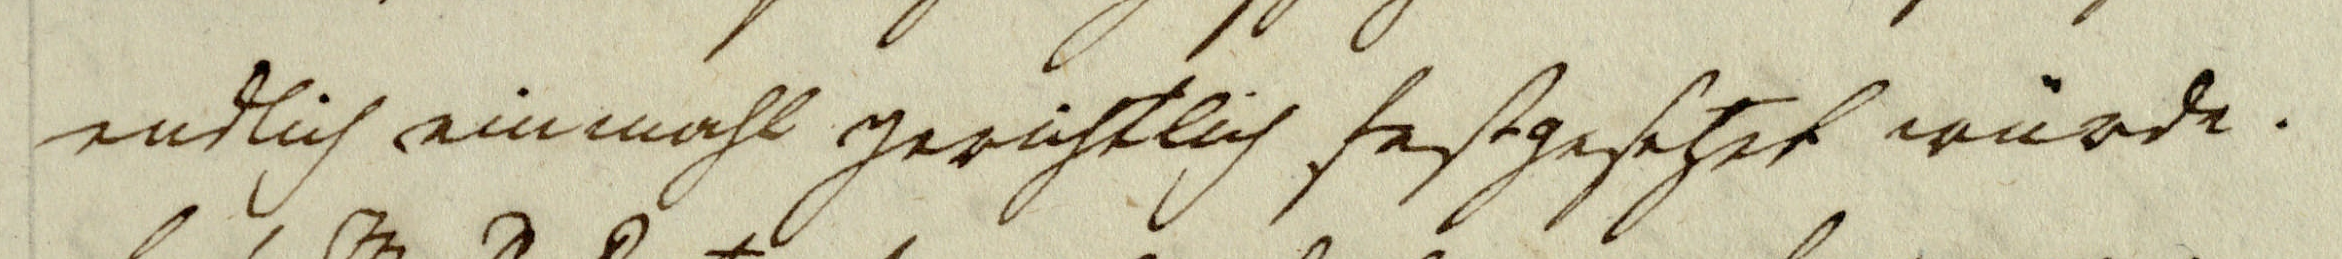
endlich einmahl gerichtlich festgesetzet würde.
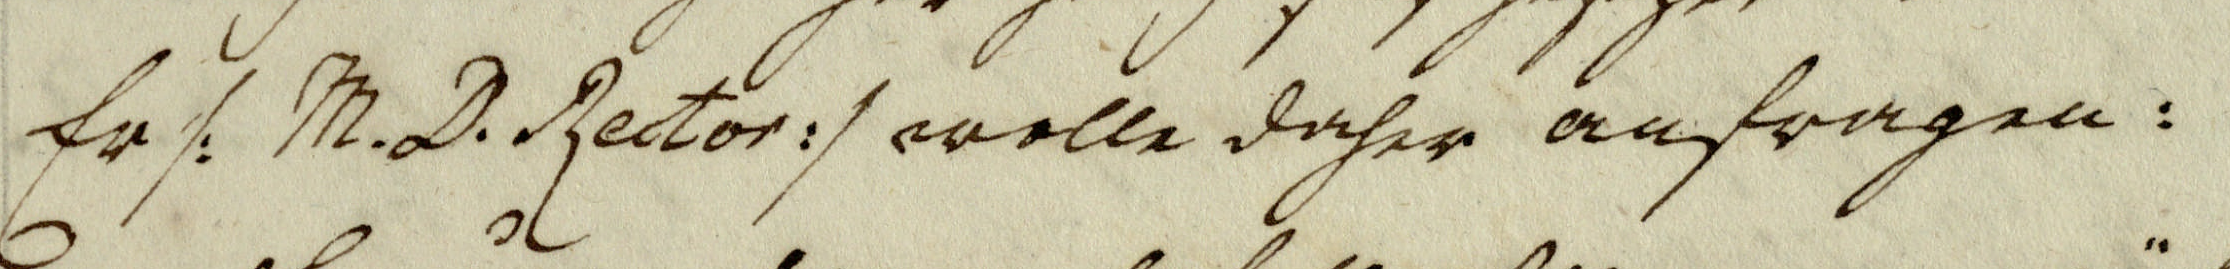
Er /: M. D. Rector :/ wolle daher anfragen:
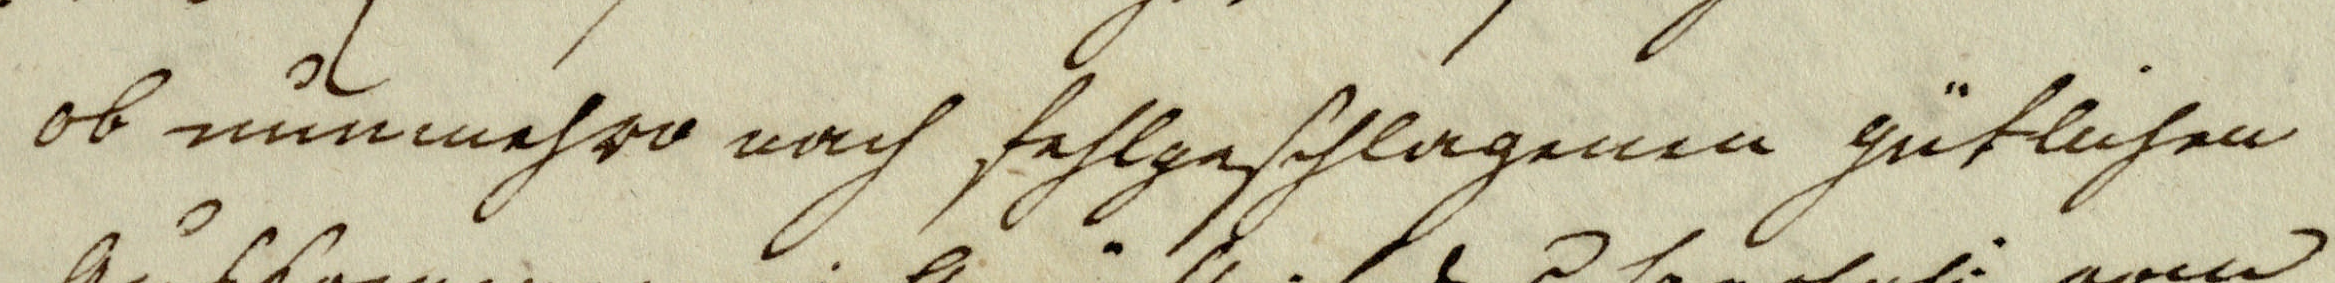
ob nunmehro nach fehlgeschlagenen gütlichen
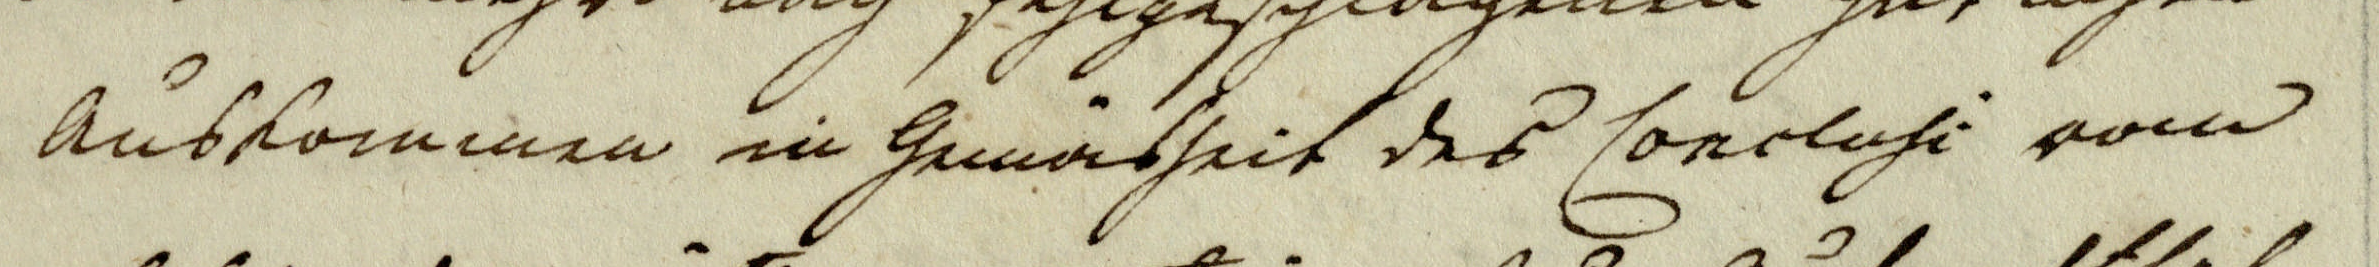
Auskommen in Gemäsheit des Conclusi vom
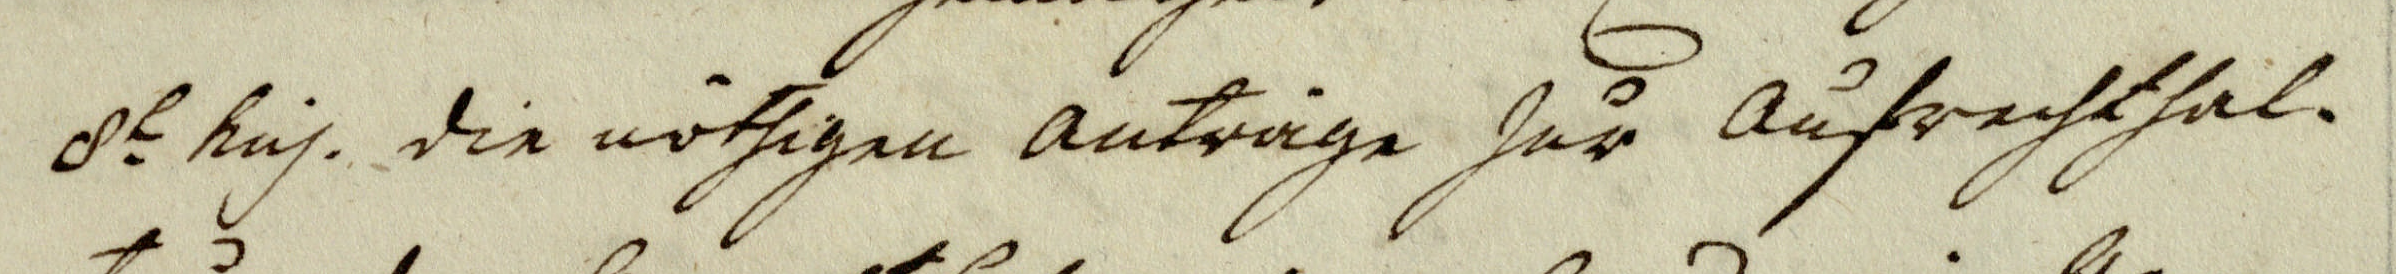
8 t huj. die nöthigen Anträge zur Aufrechthal¬
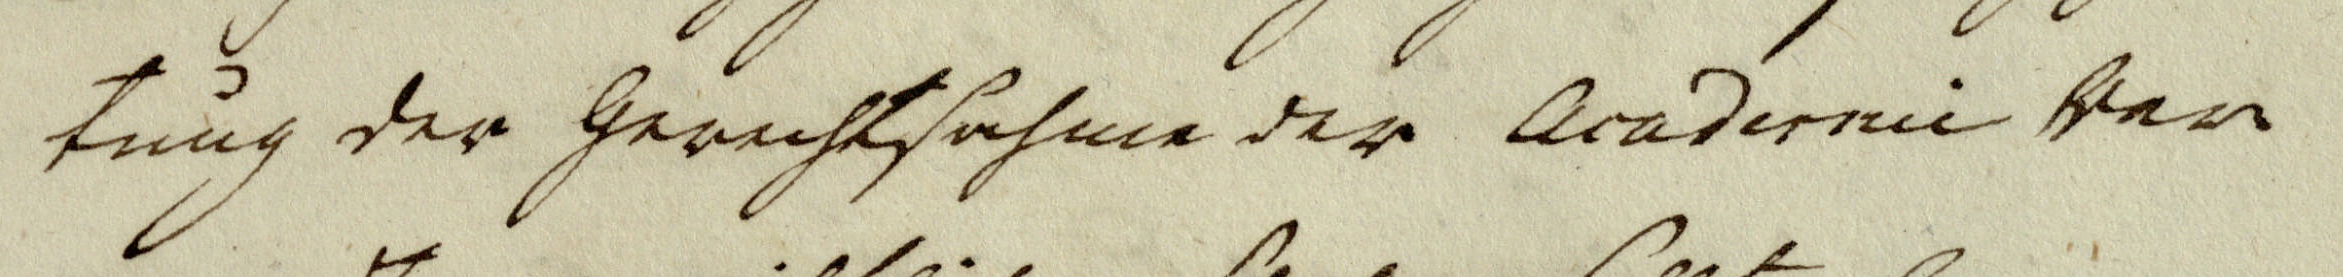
tung der Gerechtsahme der Academie er
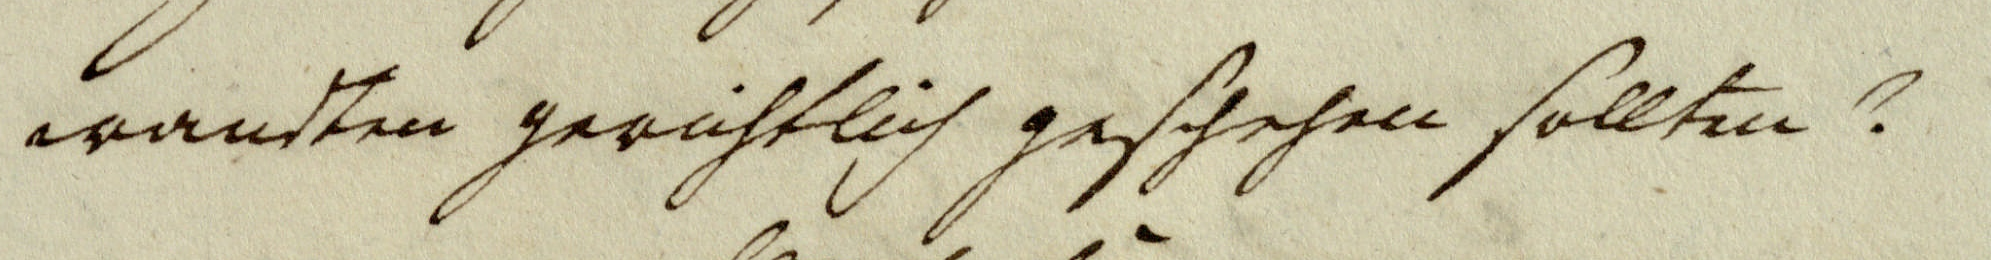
wandten gerichtlich geschehen sollten?
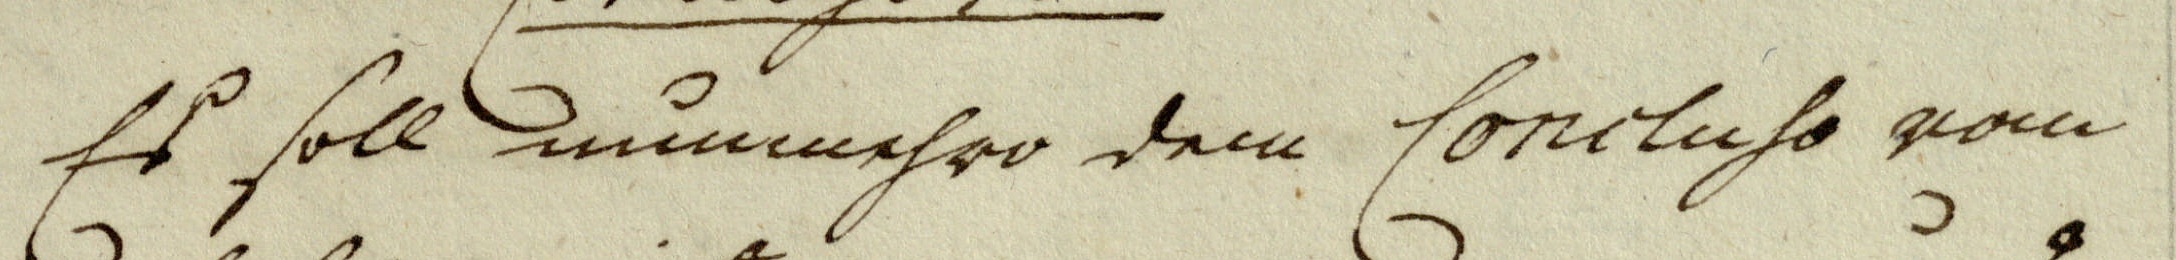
Es sonmmehro dem Concluso vom
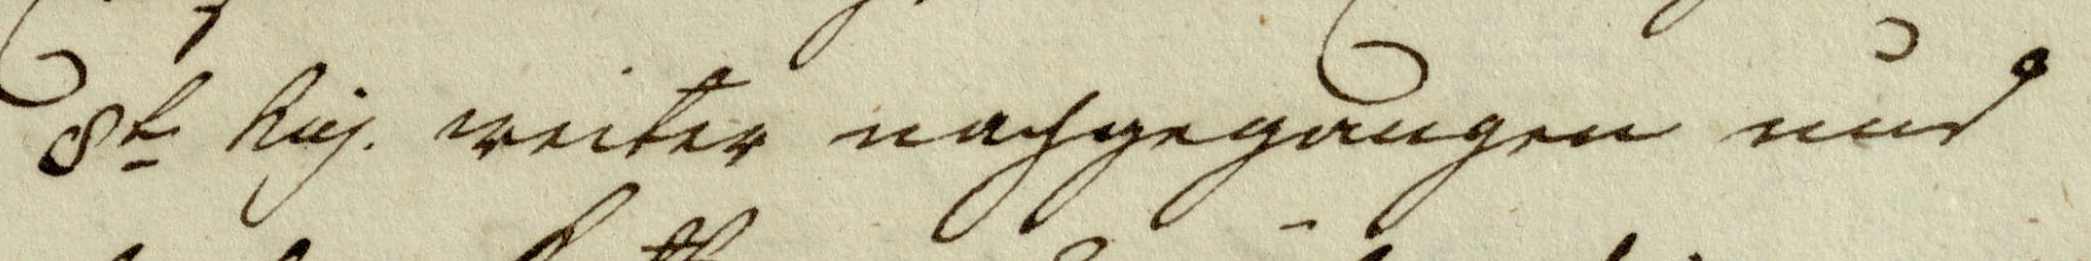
8 huj. weiter nachgegangen und
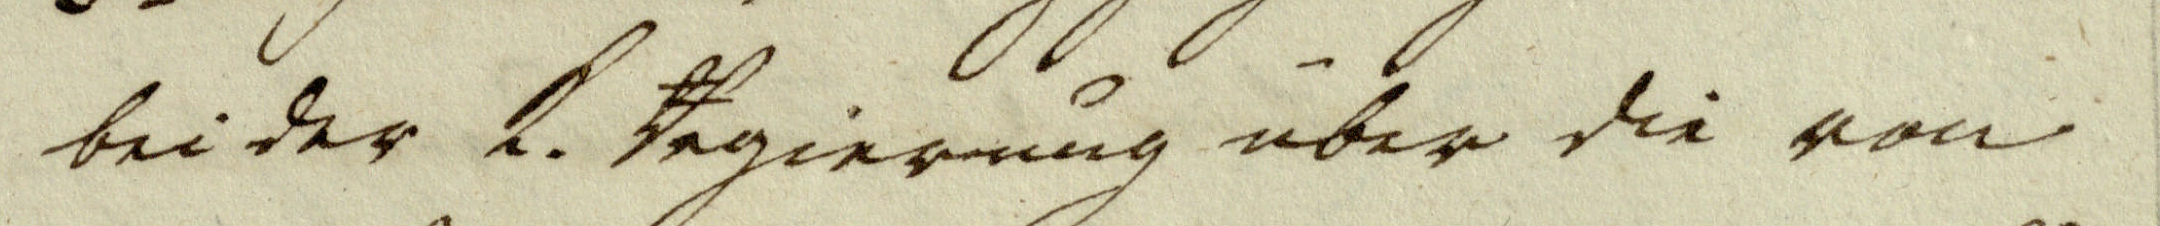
bei der K. Regierung über die von
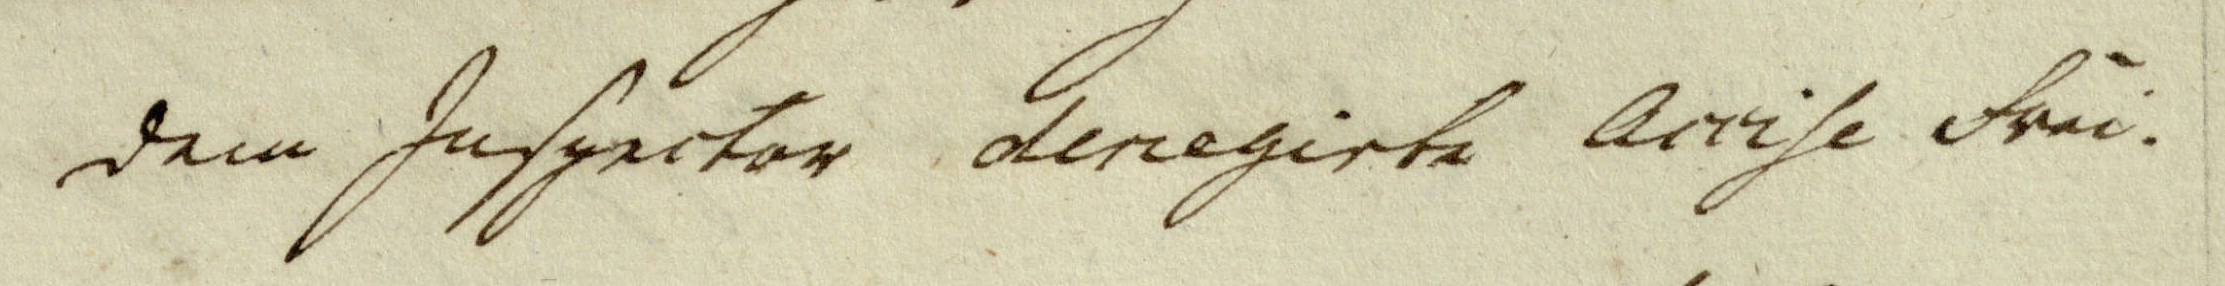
dem Inspector denegirte Accise Frei¬
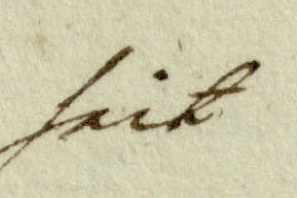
heit
